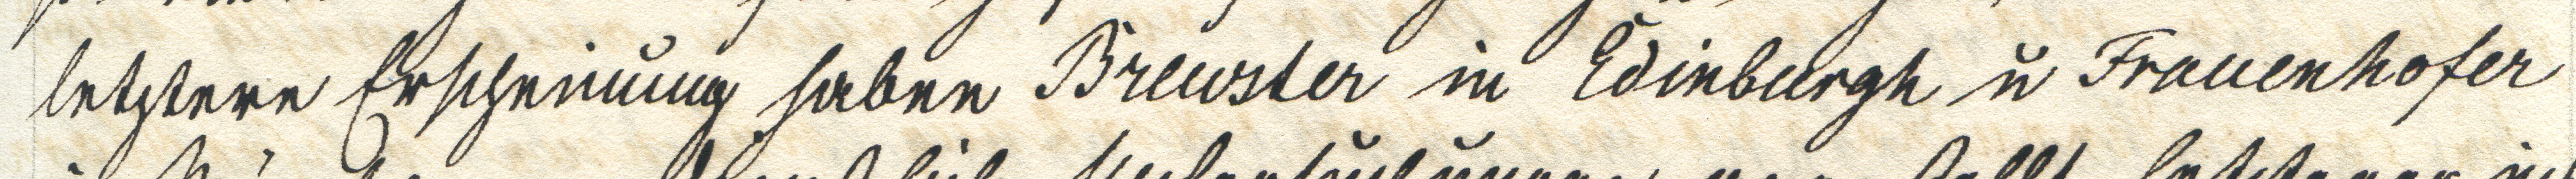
letztere Erscheinung haben Brewster in Edinburgh u Frauenhofer
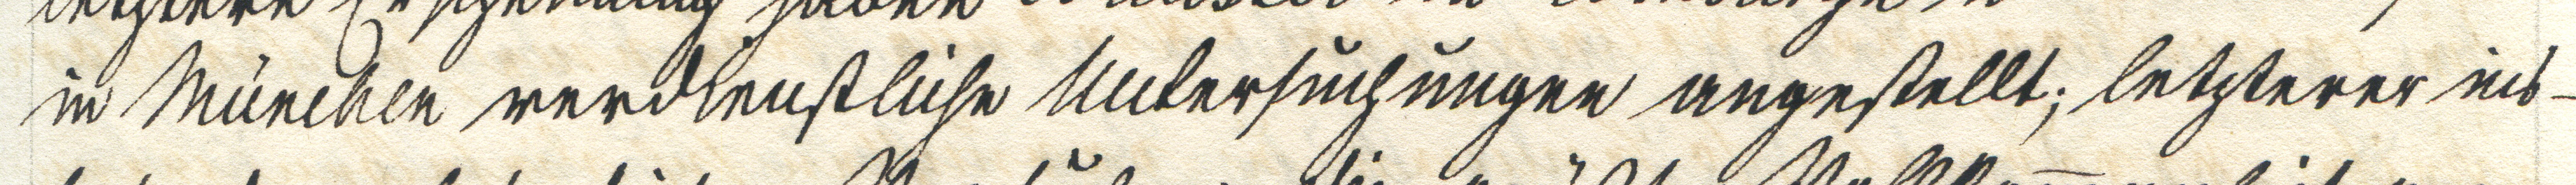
in München verdienstliche Untersuchungen angestellt; letzterer ins-
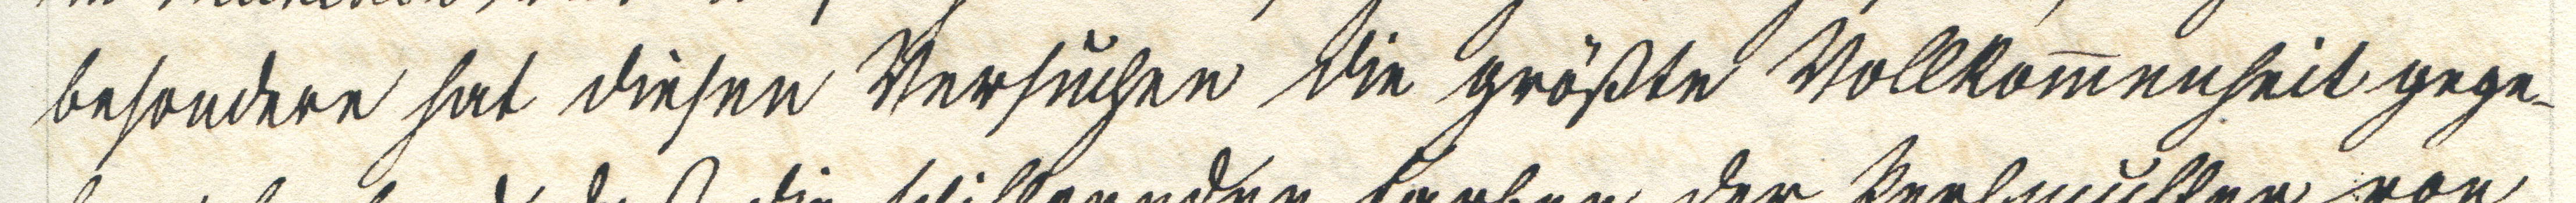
besondere hat diesen Versuchen die größte Vollkom̃enheit gege-
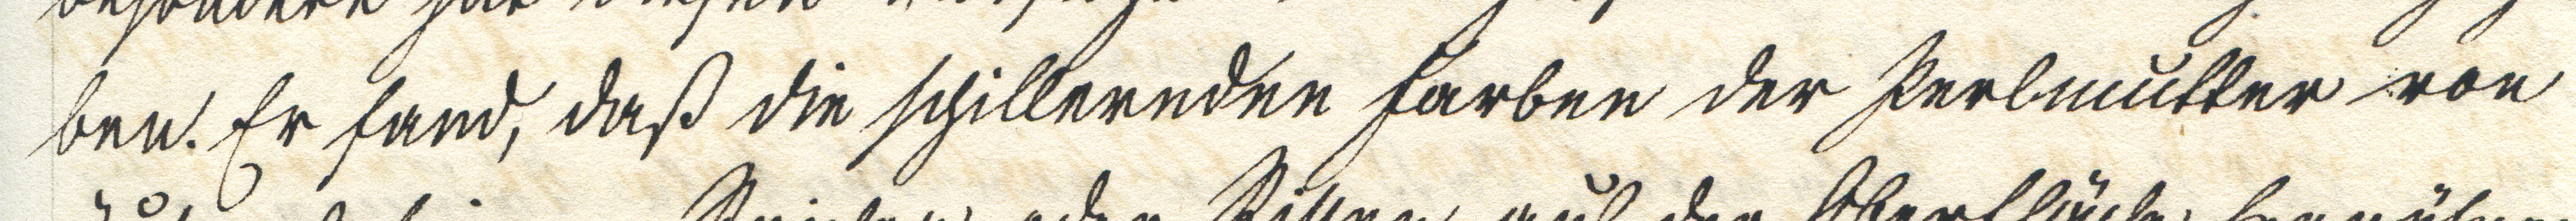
ben. Er fand, daß die schillernden Farben der Perlmutter von
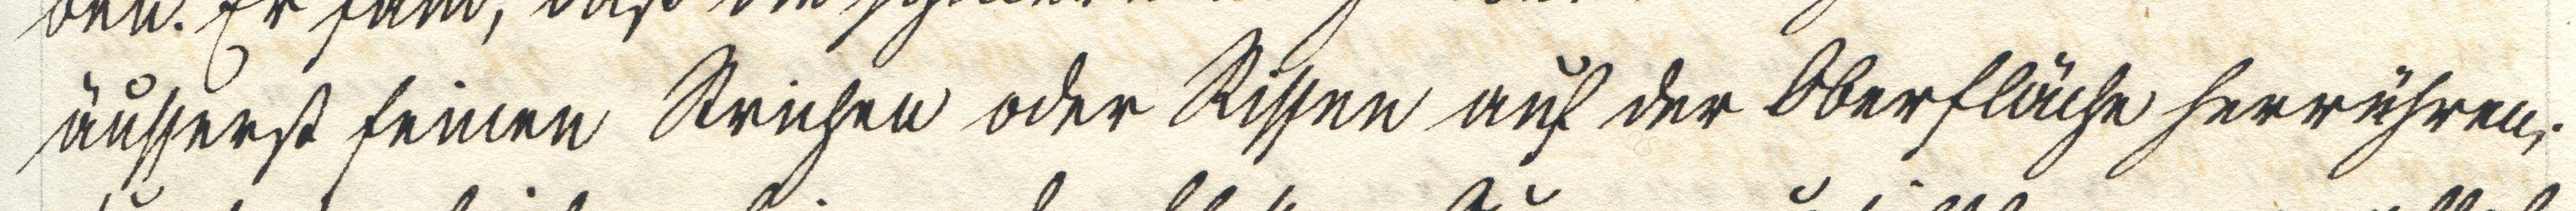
äusserst feinen Strichen oder Rissen auf der Oberfläche herrühren;
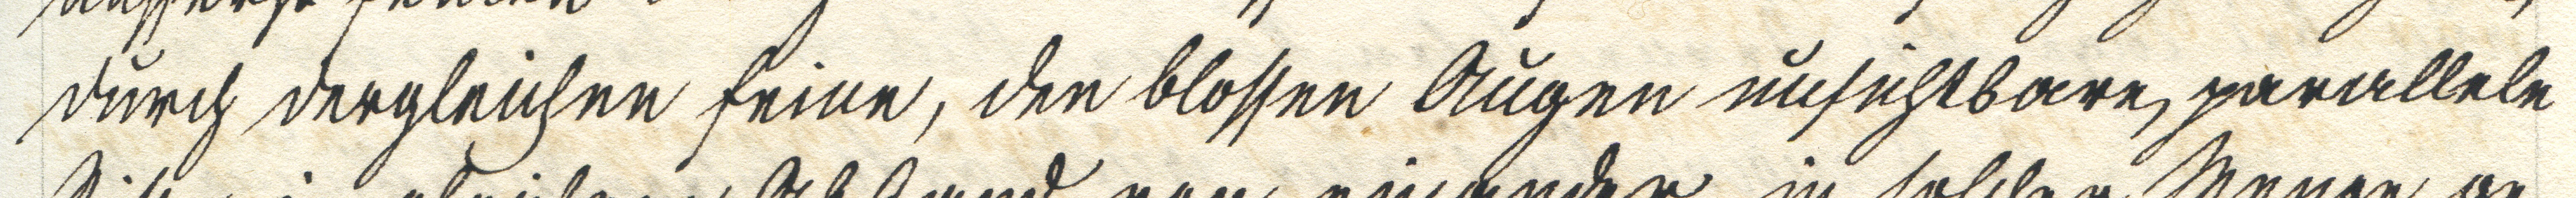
durch dergleichen feine, den blossen Augen unsichtbare, parallele
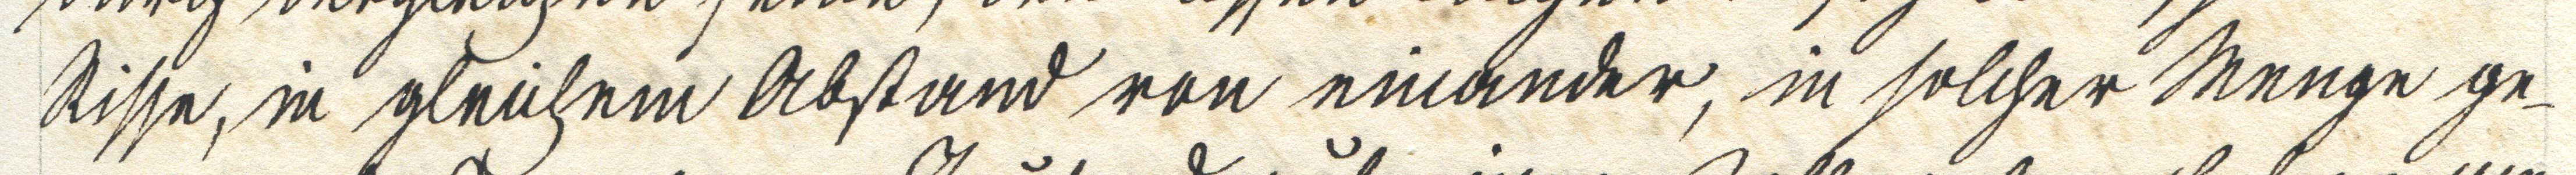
Risse, in gleichem Abstand von einander, in solcher Menge ge-
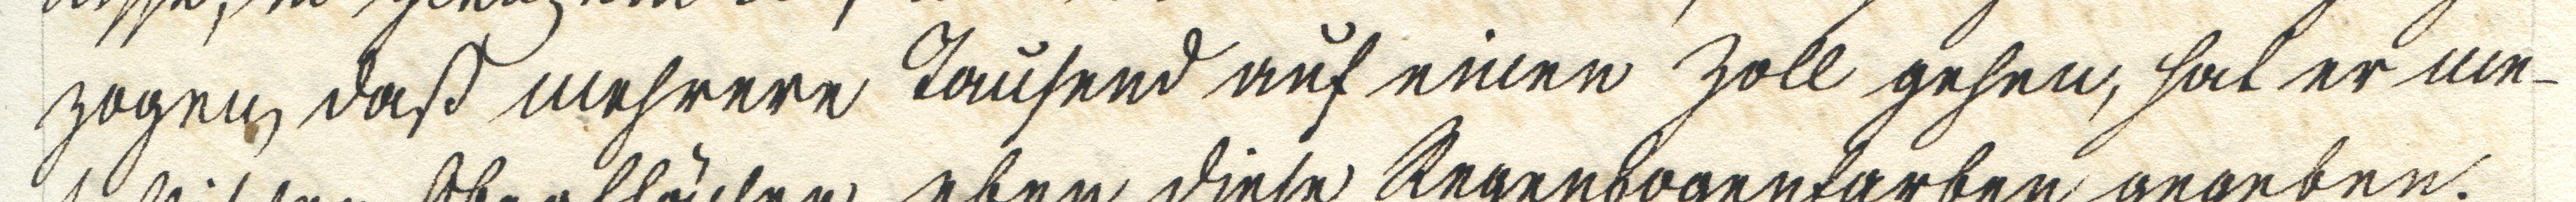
zogen, daß mehrere Tausend auf einen Zoll gehen, hat er me-
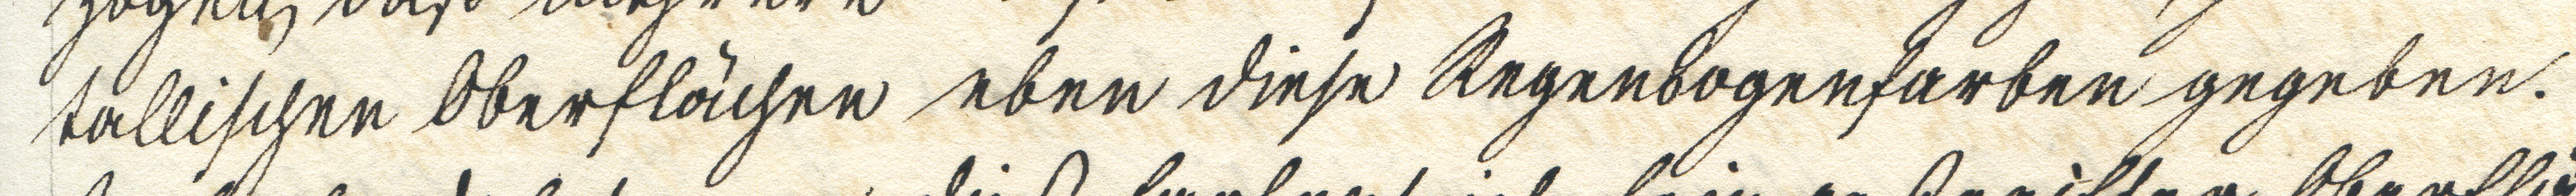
tallischen Oberflächen eben diese Regenbogenfarben gegeben.
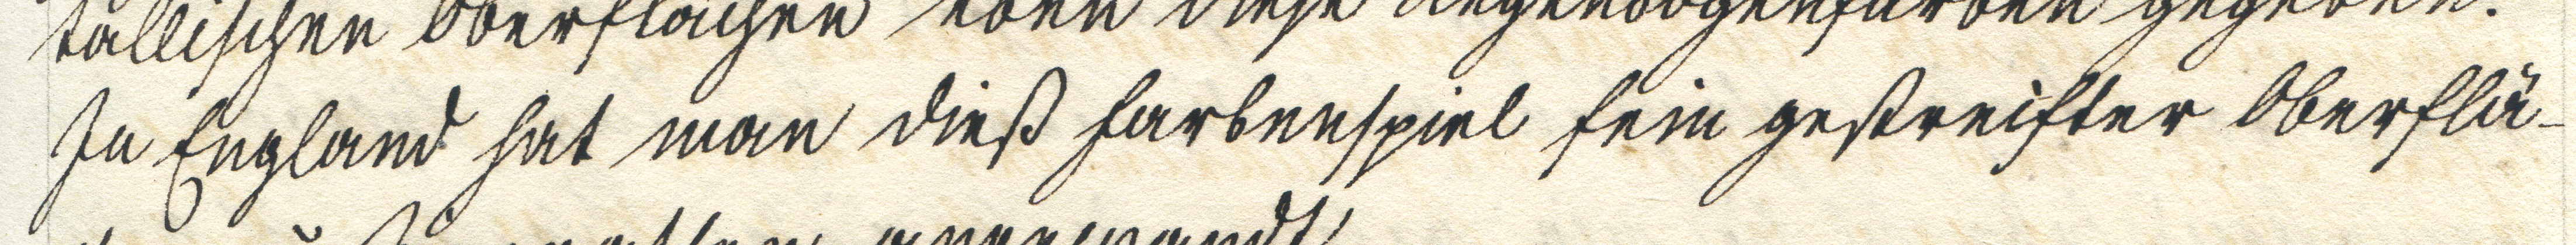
In England hat man dieß Farbenspiel fein gestreifter Oberflä-
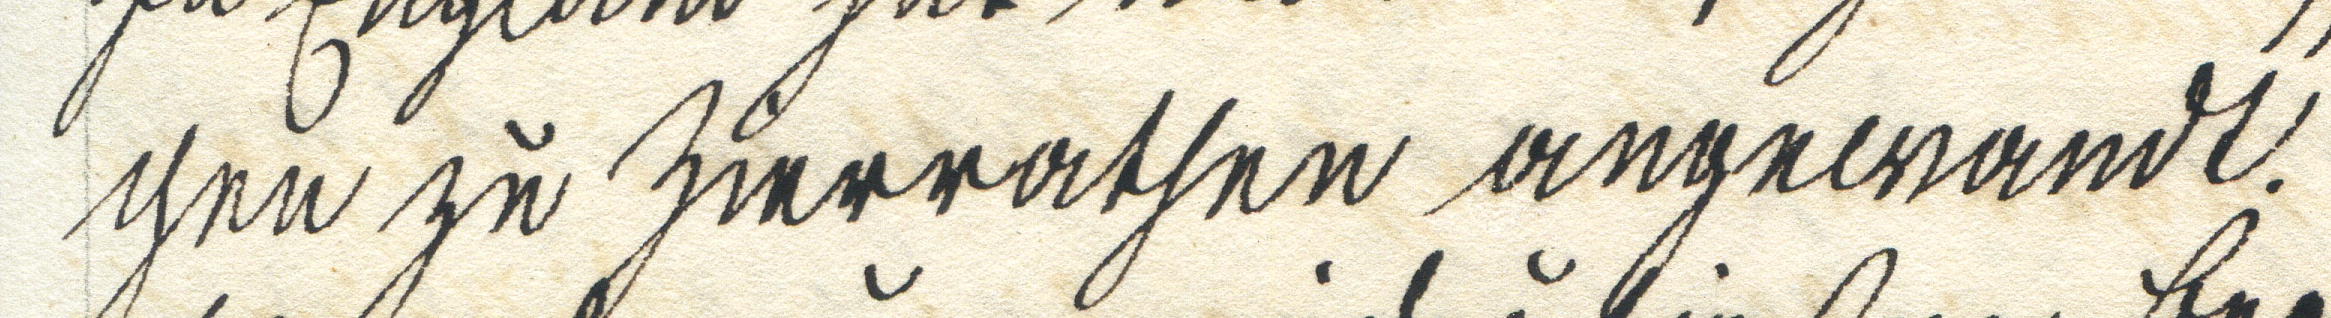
chen zu Zierrathen angewandt.
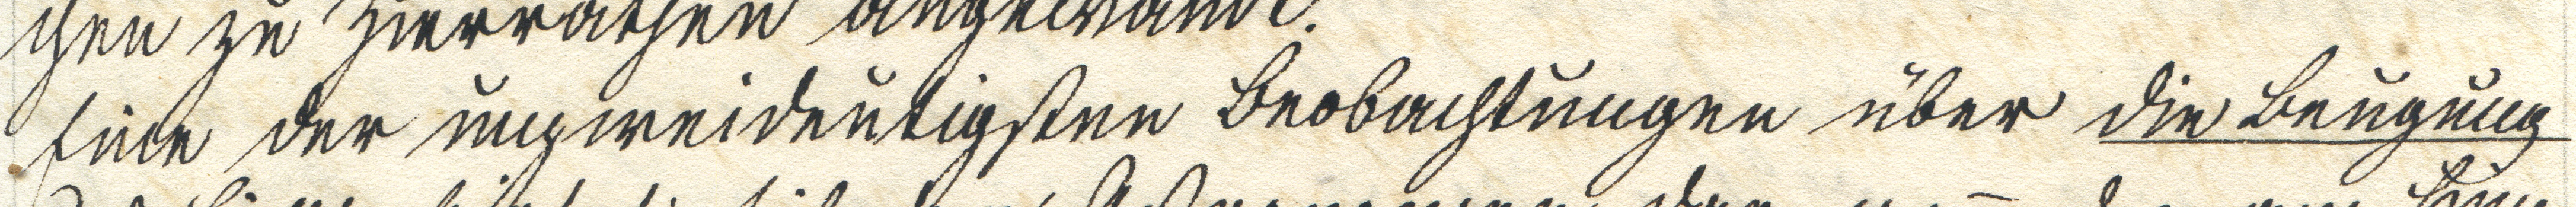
Eine der unzweideutigsten Beobachtungen über die Beugung
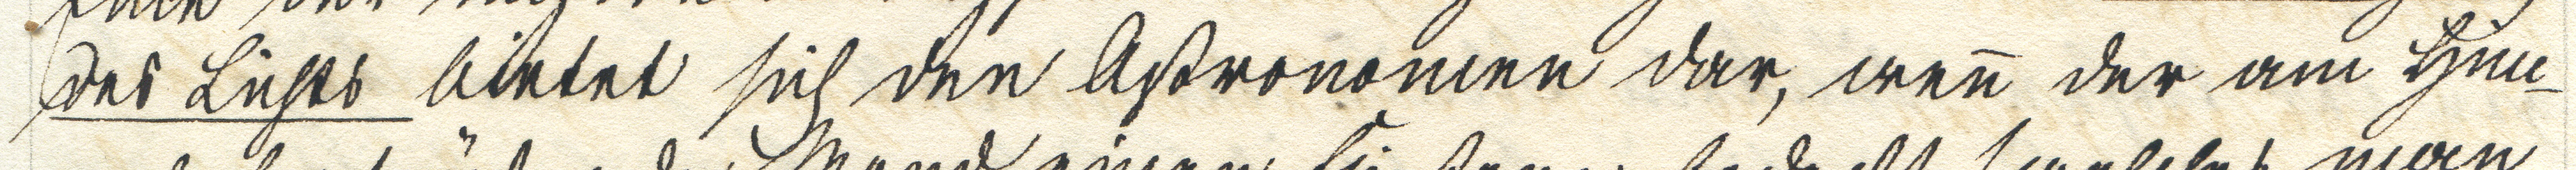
des Lichts bietet sich den Astronomen dar, weñ der am Him-
